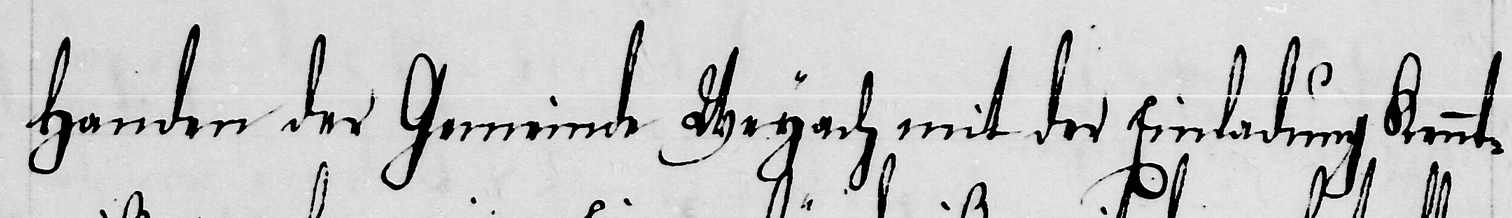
Handen der Gemeinde Weyach mit der Einladung Ken¬
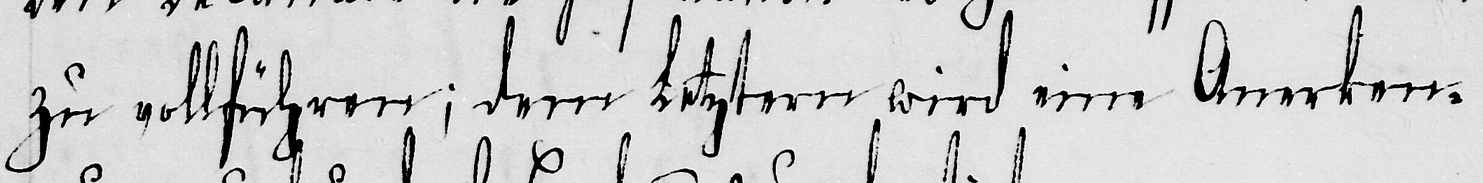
zu vollführen; dem Letztern wird eine Anerken¬
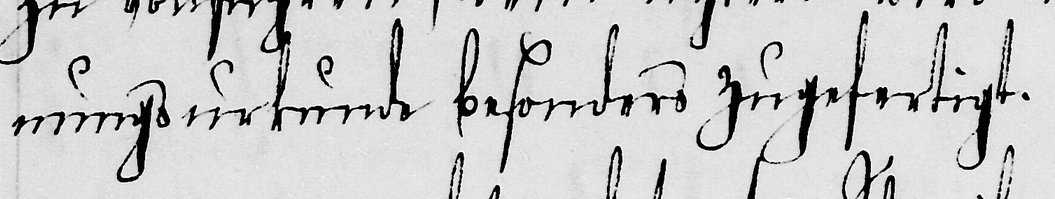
nungsurkunde besonders zugefertigt.
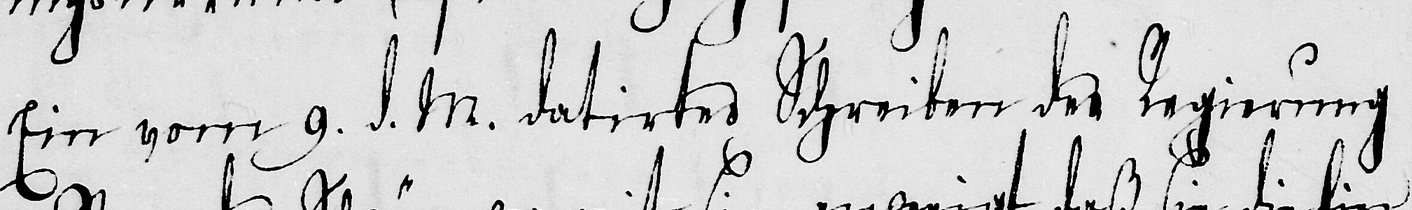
Ein vom 9. d. M. datirtes Schreiben der Regierung
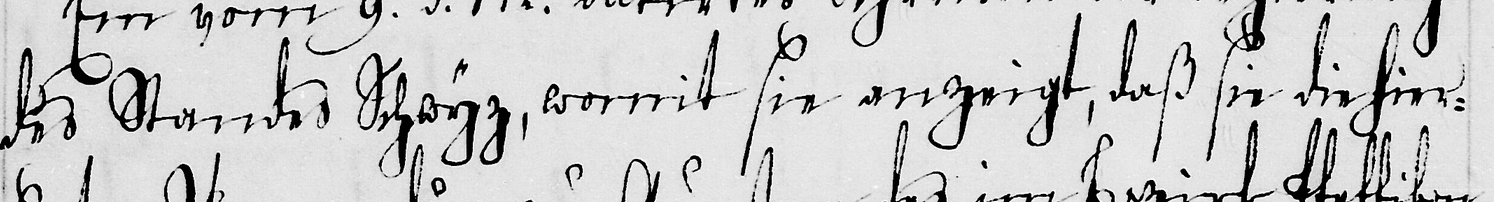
des Standes Schwyz, womit sie anzeigt, daß sie die hier¬
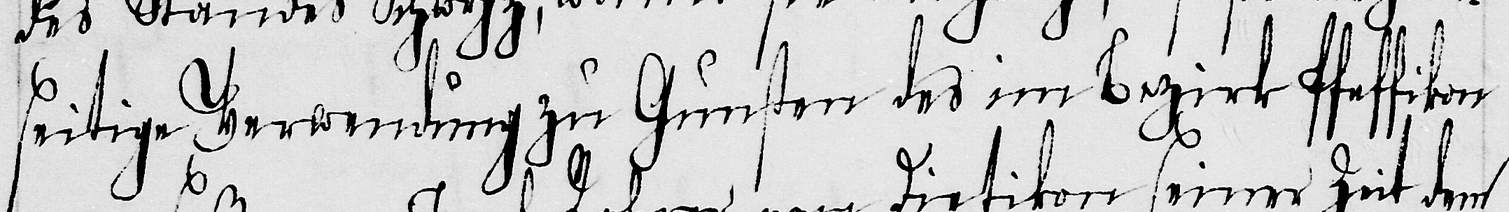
seitige Verwendung zu Gunsten des im Bezirk Pfeffikon
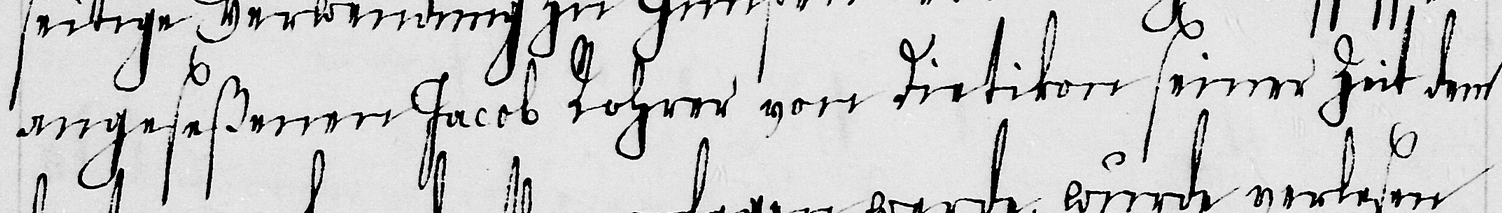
angeseßenen Jacob Rohrer von Dietikon seiner Zeit dem
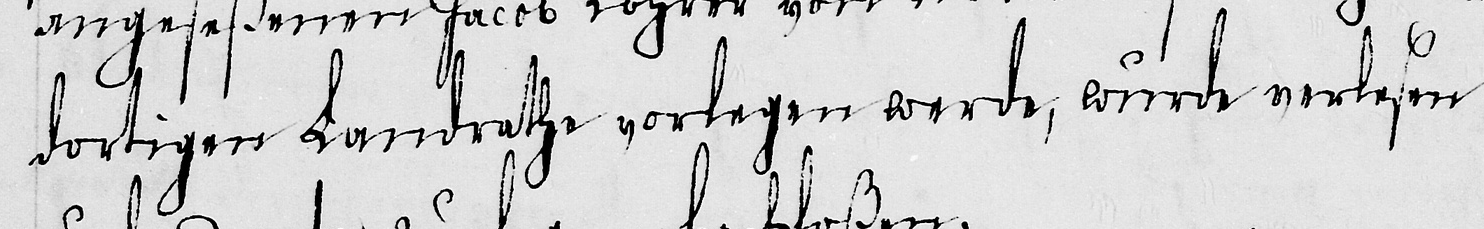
dortigen Landrathe vorlegen werde, wurde verlesen
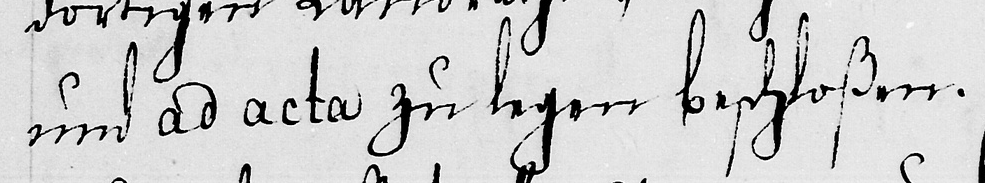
und ad acta zu legen beschloßen.
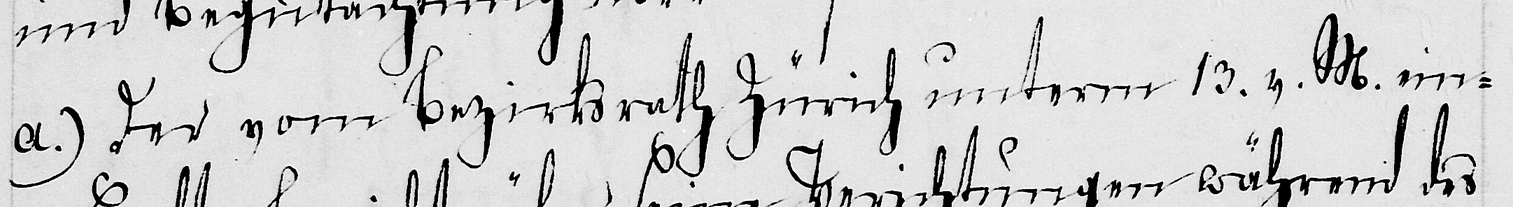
a.) Der vom Bezirksrath Zürich unterm 13. v. M. ein¬
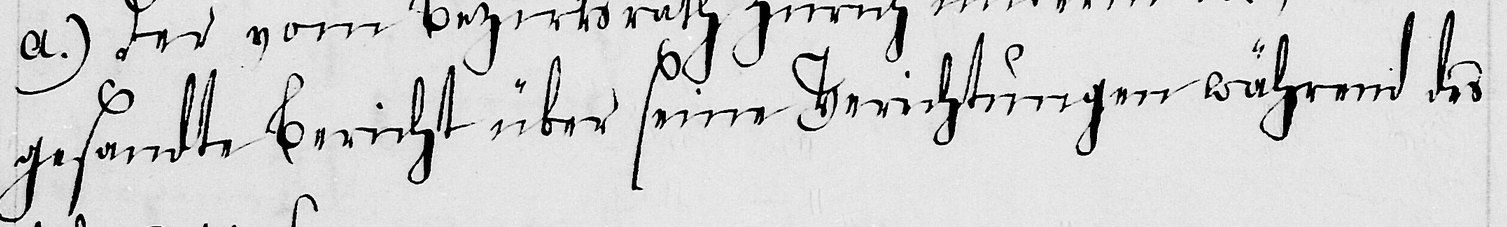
gesandte Bericht über seine Verrichtungen während des
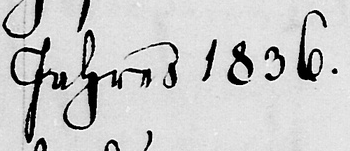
Jahres 1836.
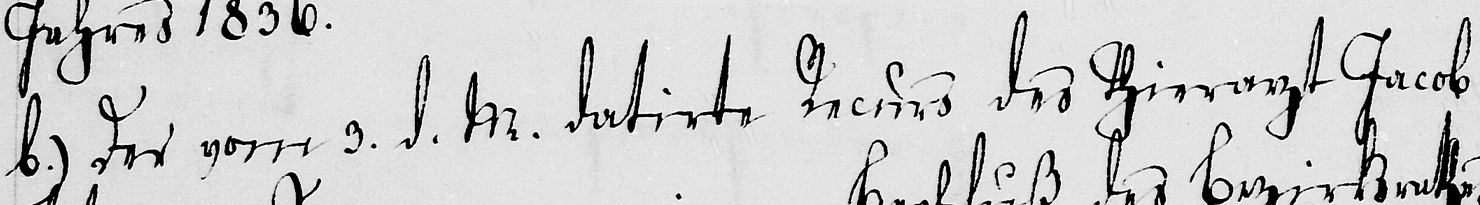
b.) Der vom 3. d. M. datirte Recurs des Thierarzt Jacob
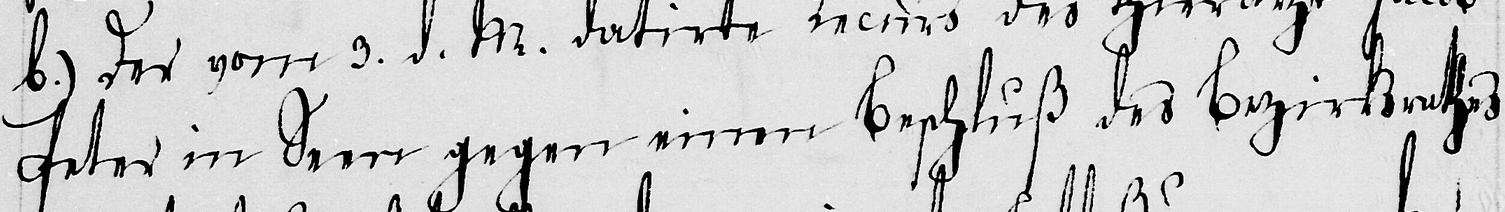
Peter in Seen gegen einen Beschluß des Bezirksrathes
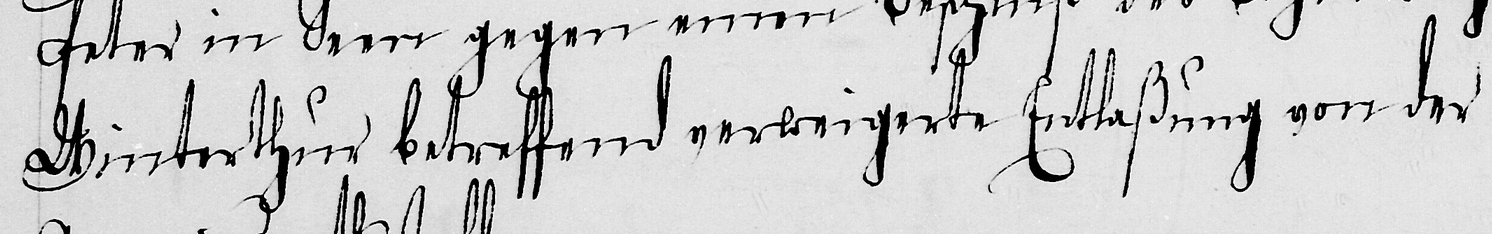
Winterthur betreffend verweigerte Entlaßung von der
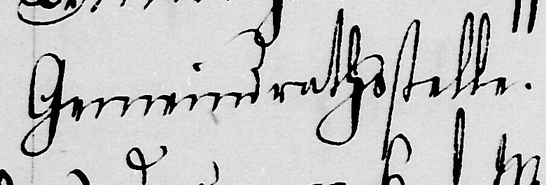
Gemeindrathsstelle.
